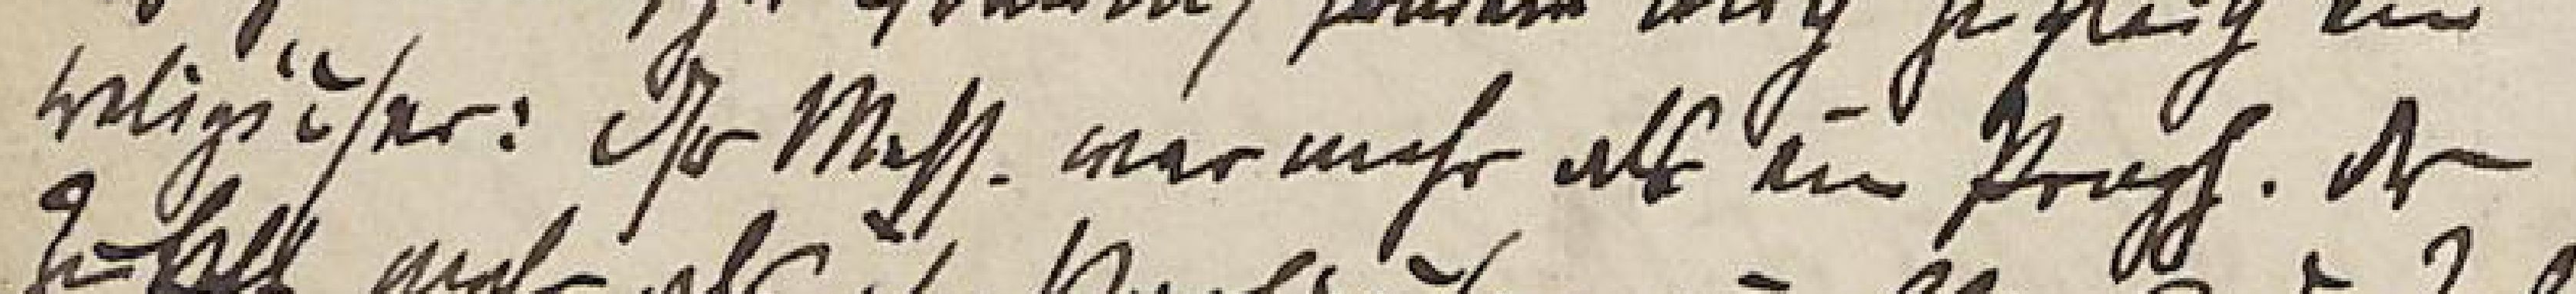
religiöser: Dsr Mensch war mehr als ein Proph. dr
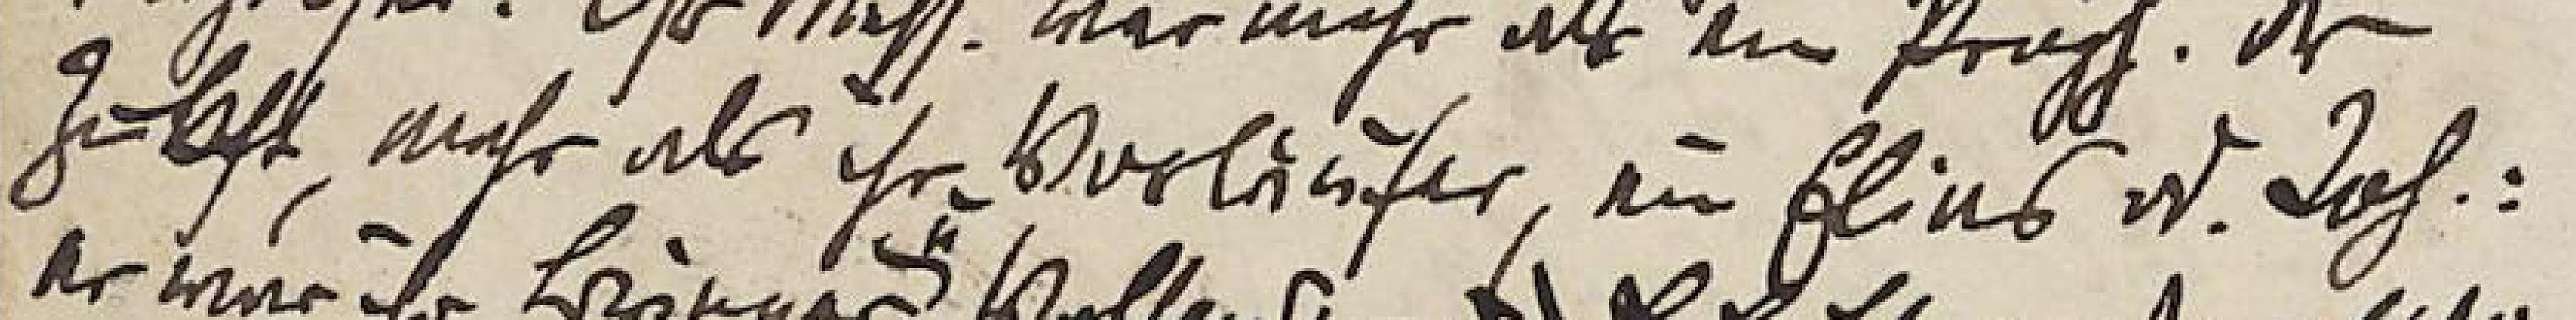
Zukft, mehr als ih Vorläufer, ein Elias od. Joh.:
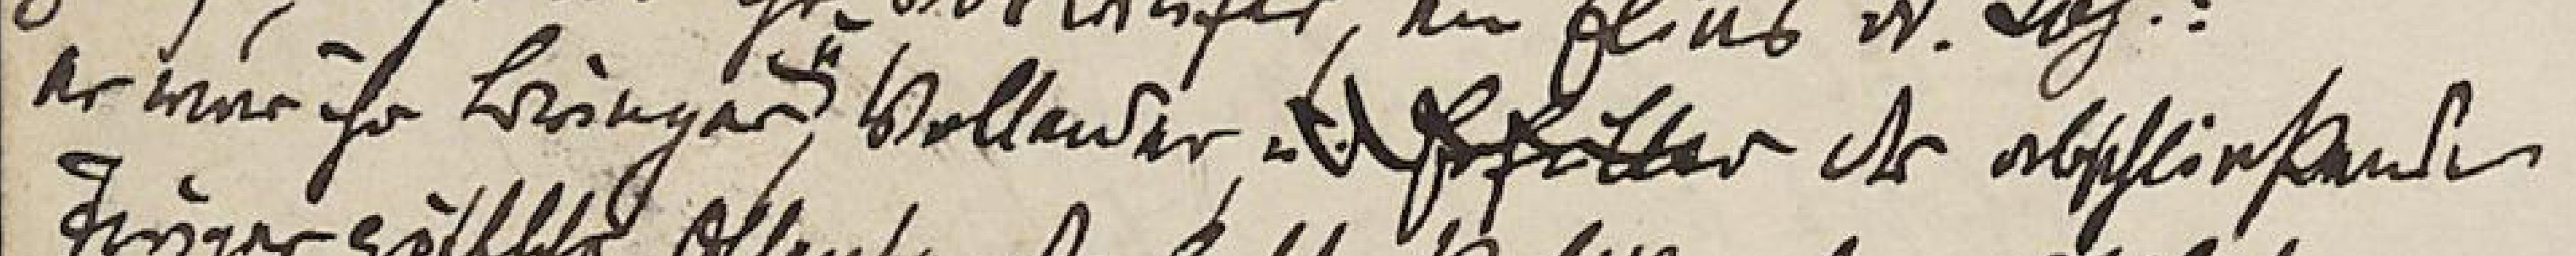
er war ihr Bringer u. Vollender u. Erfüller der abschließende
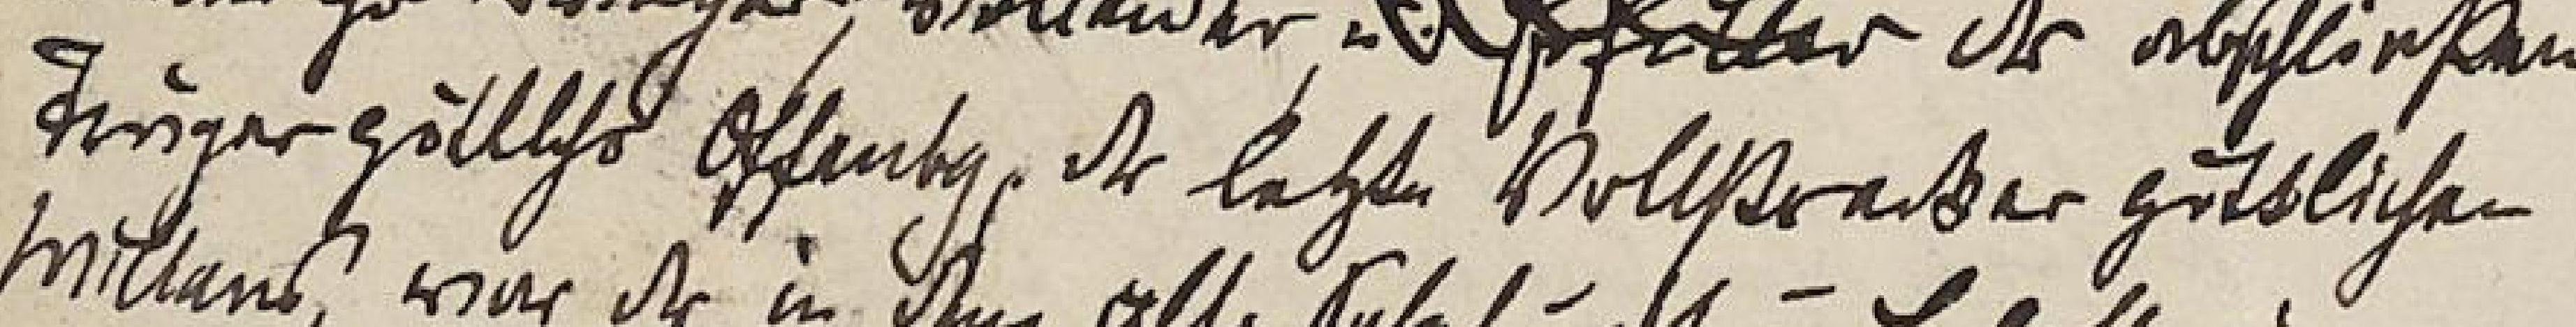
Träger göttlicher Offenbg, dr letzte Vollstrecker göttlichen
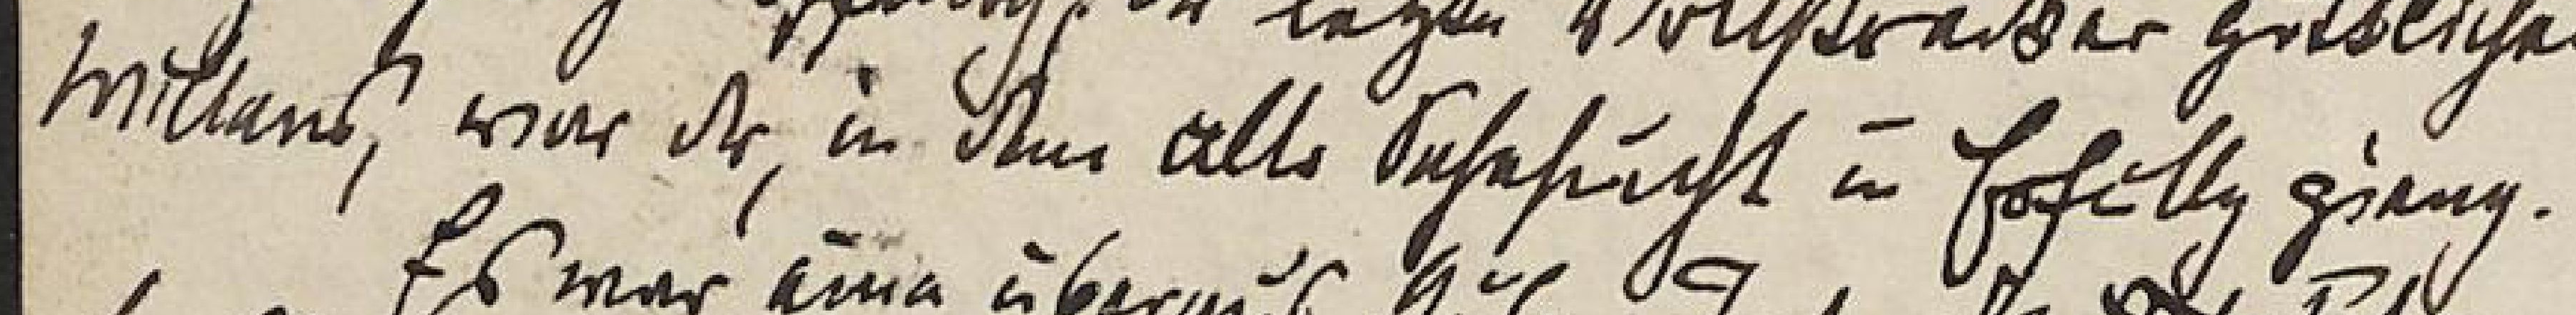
Willens, war dr, in dem alle Sehnsucht in Erfüllg gieng.
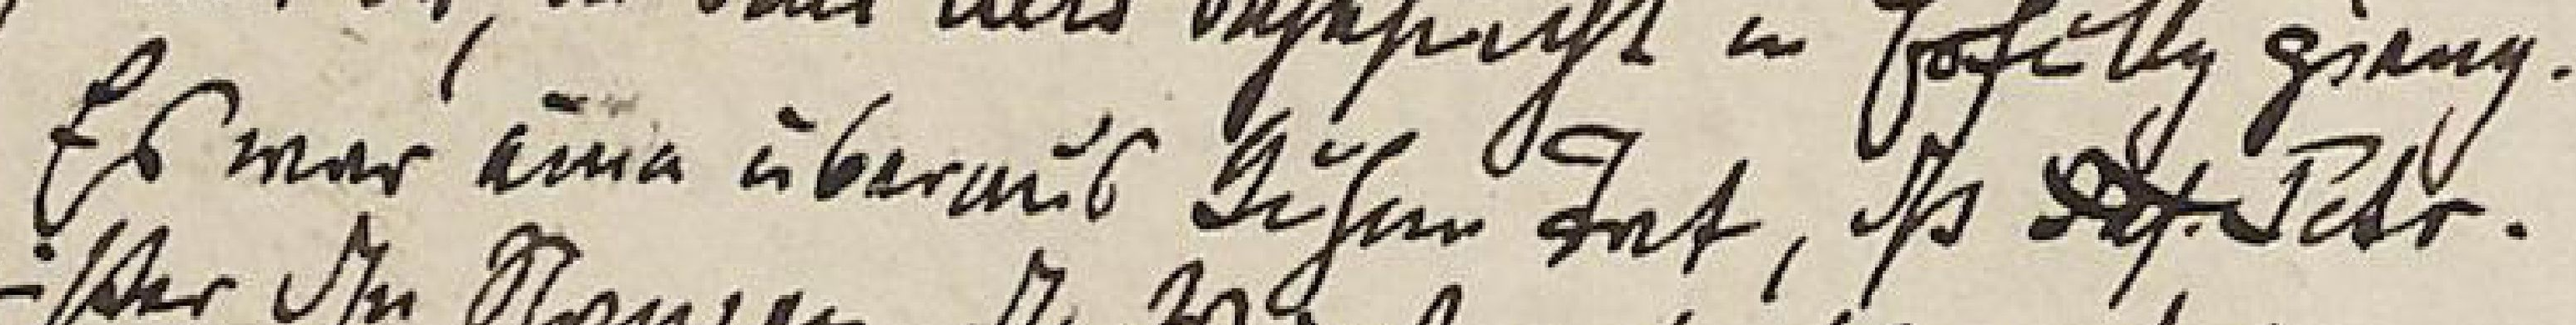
Es war eine überaus kühne Tat, daß uns. Petr.
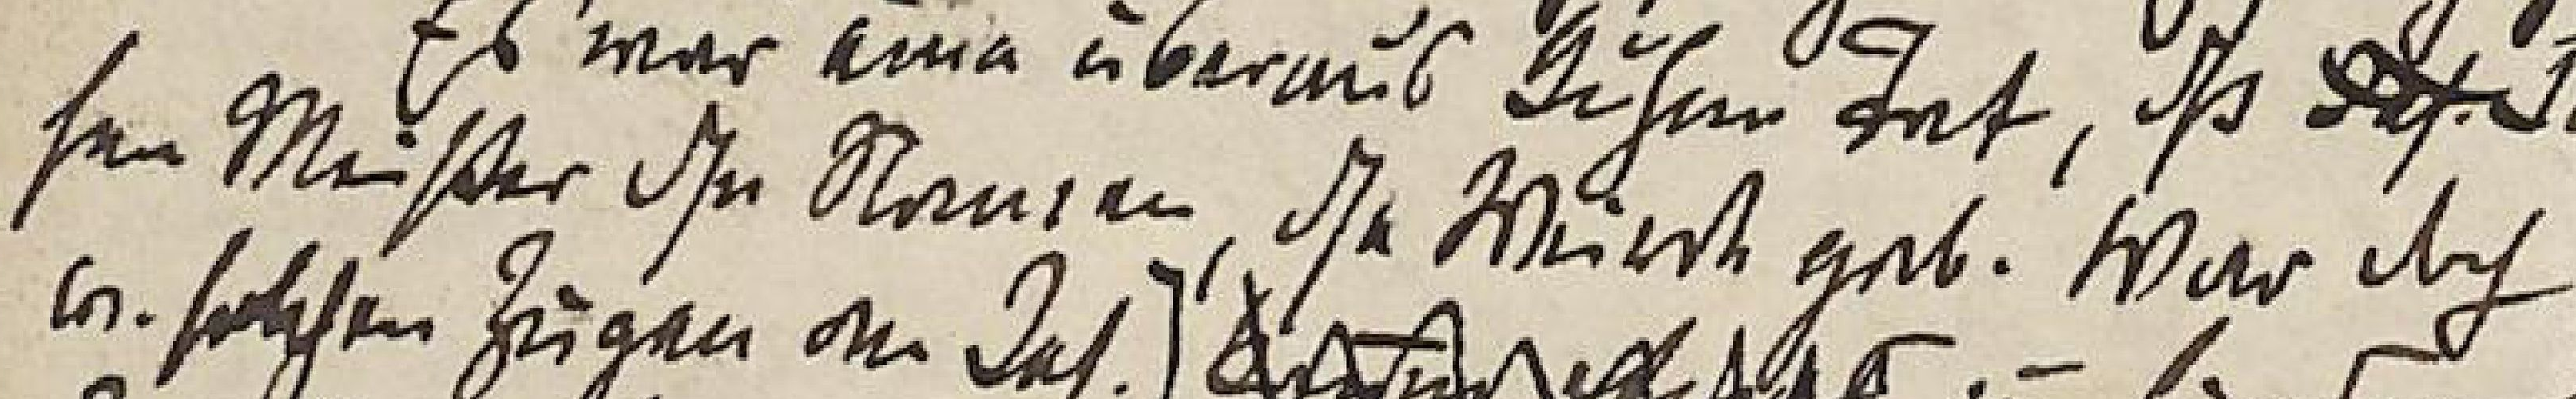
snn Meister dsn Namen, dse Würde gab. War doch
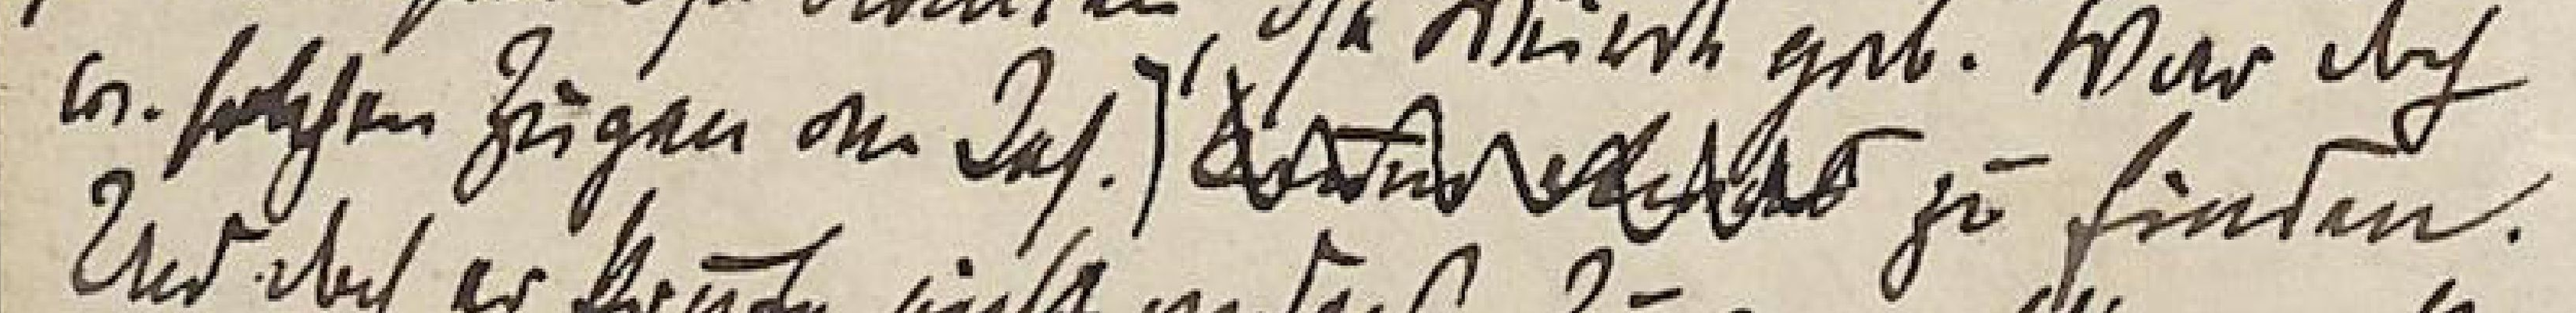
v. solchen Zügen an Jes. ] kaum etwas zu finden.
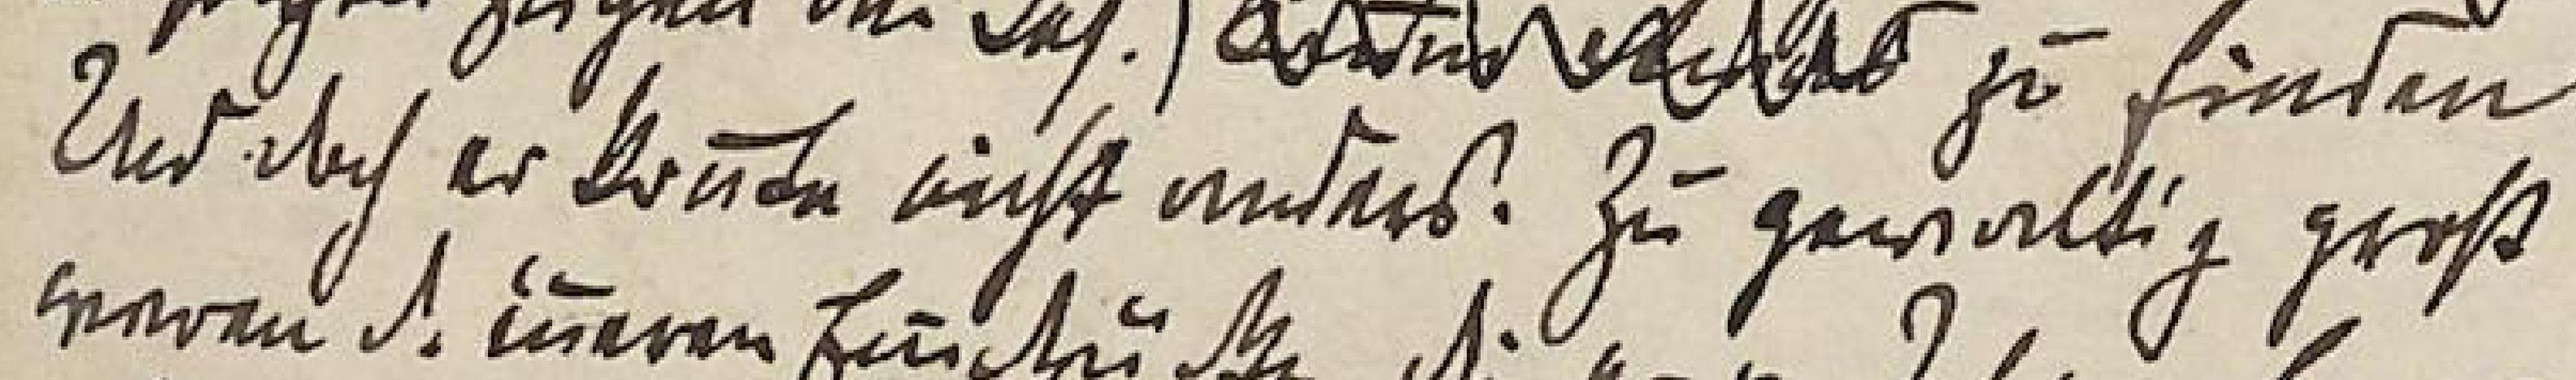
Und doch er konte nicht anders. Zu gewaltig groß
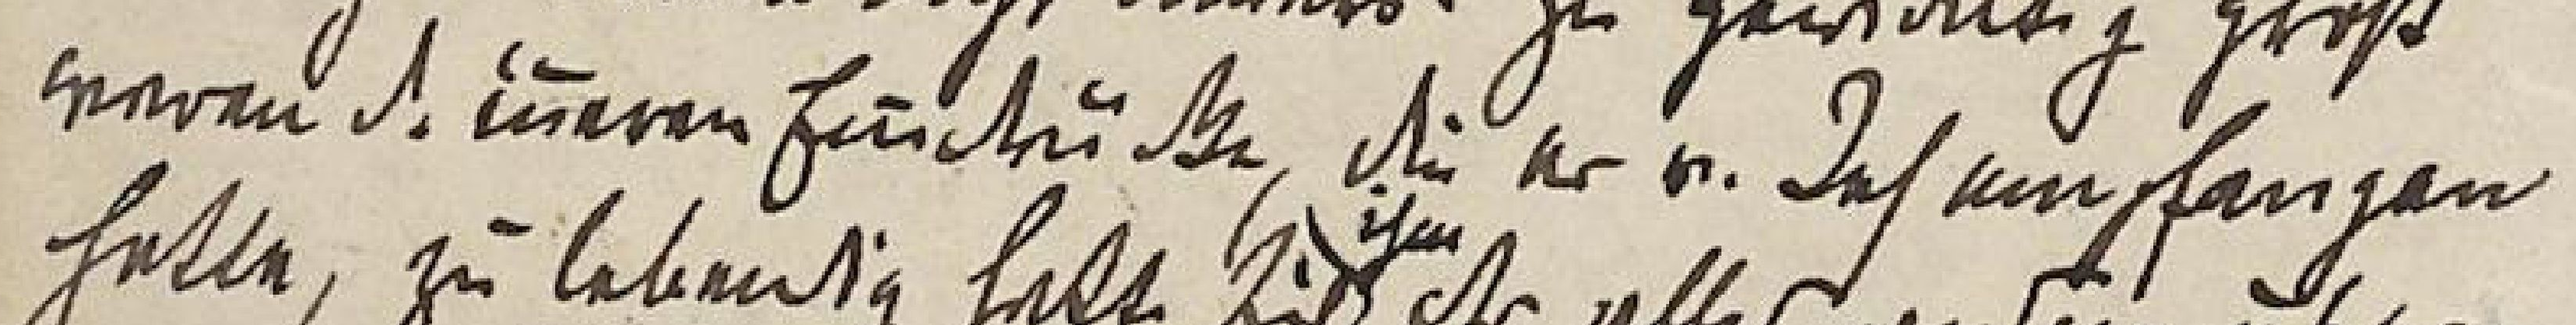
waren d. ineren Eindrücke, die er v. Jes empfangen
